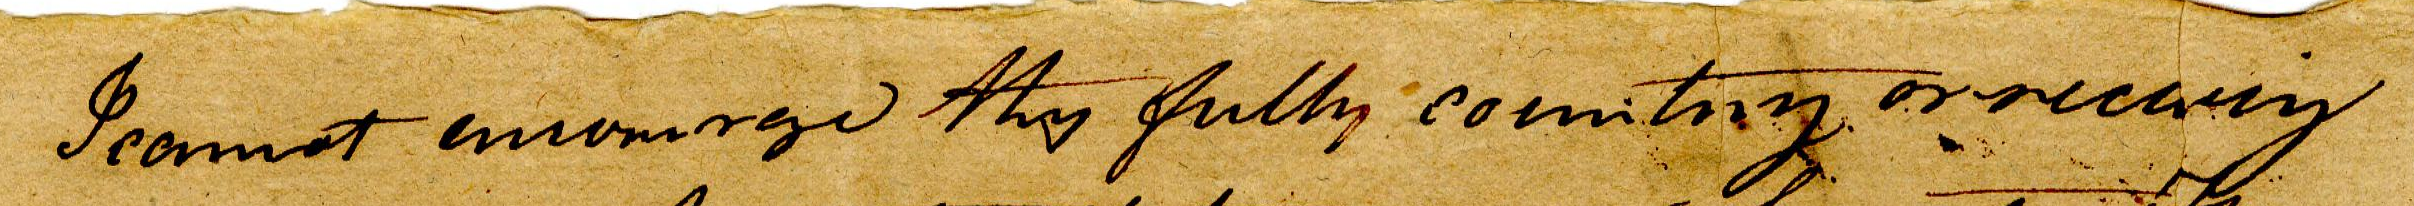I cannot encourage thy fully comiting or receiving
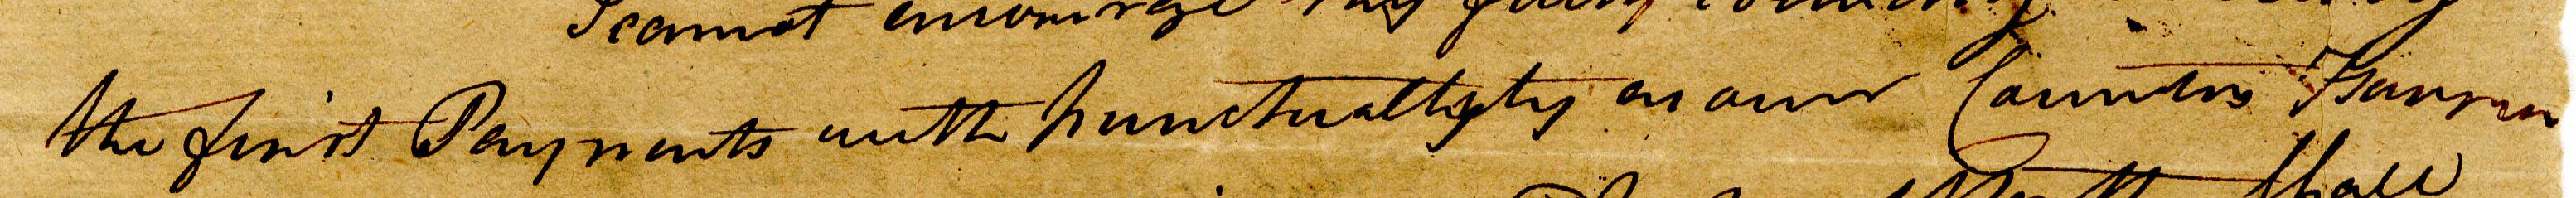the first Payments with punctuality as our Country Farmer
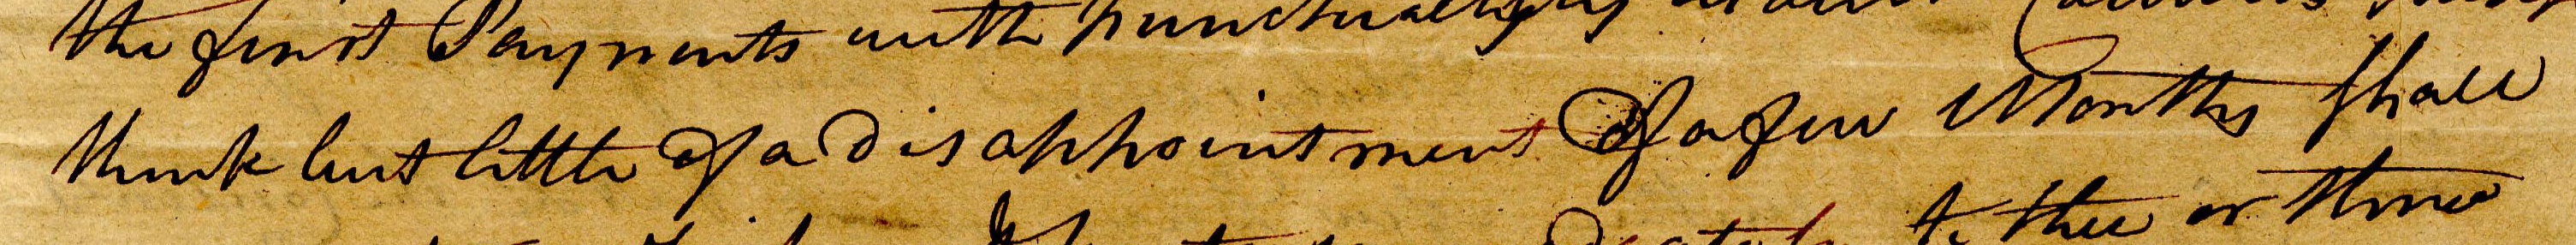think but little of a disappointment of a few months shall
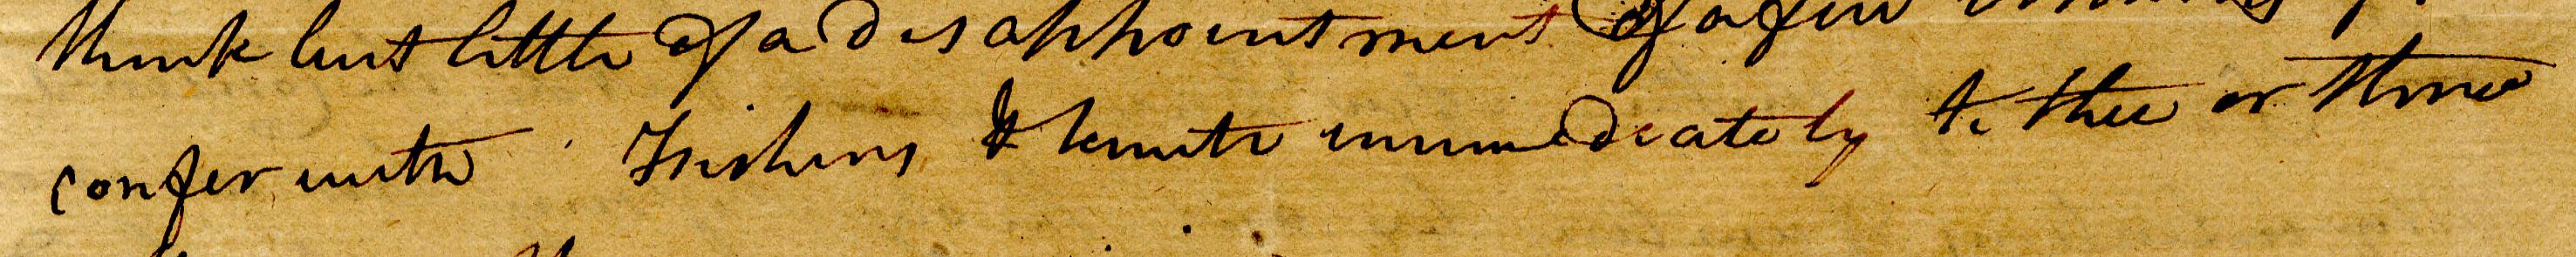confer with Fishers & remite immediately to thee or thme
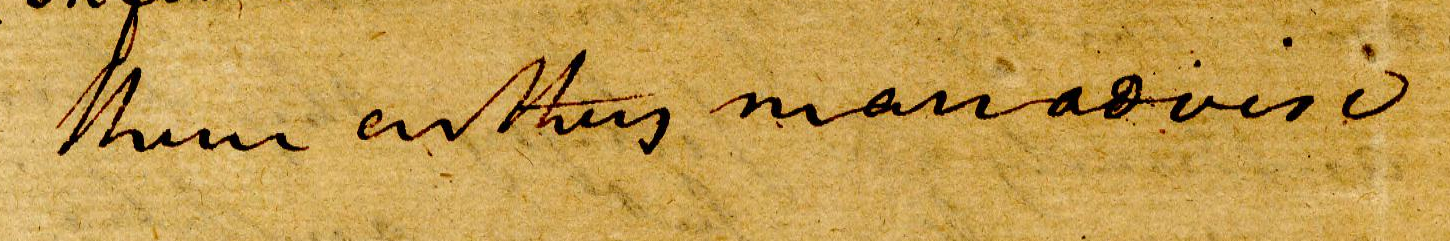them as they man advise
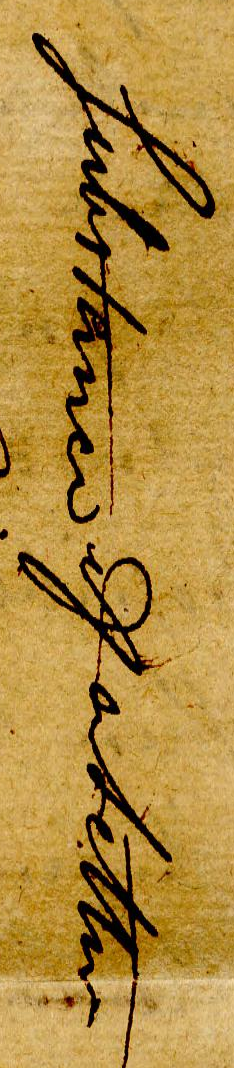Substance of a letter
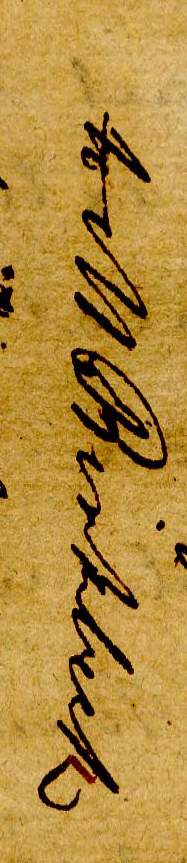to M Birkbeck
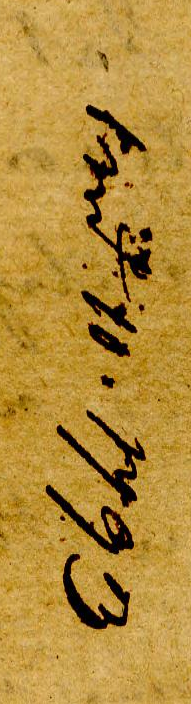1 m^o 10 1793
